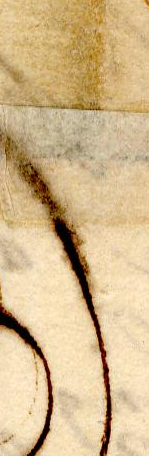To
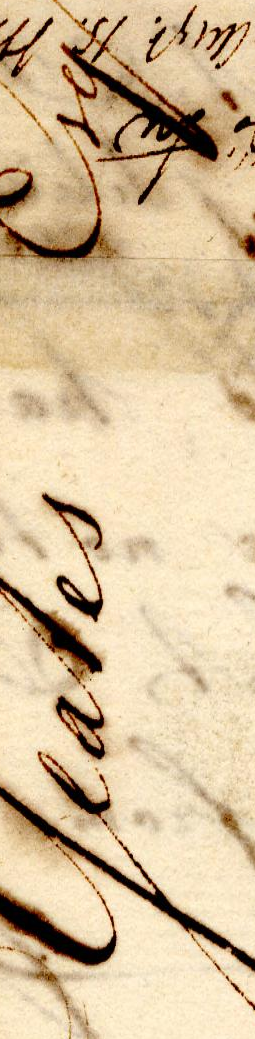Yeates Esq
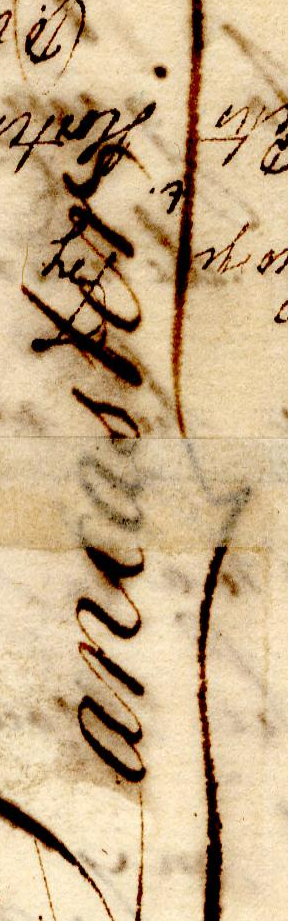Lancaster
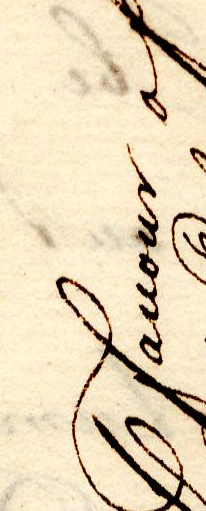Per favour of
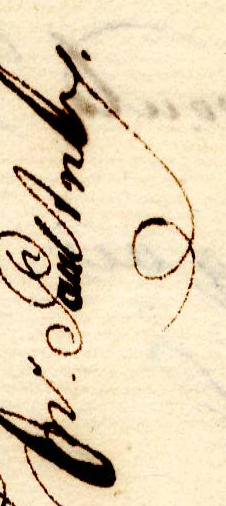M^r Paul Inoy
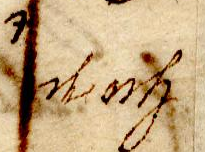George Fry
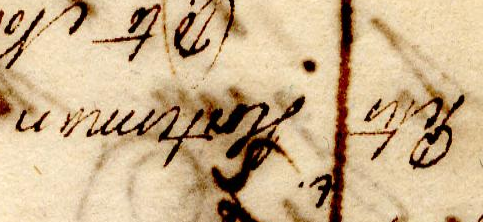Peter Horteman
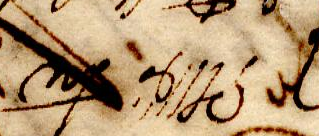Pllll tre
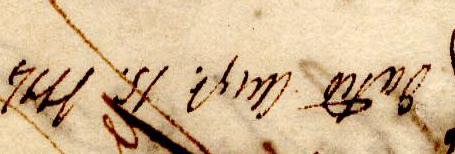dated Aug^t. 15. 1774
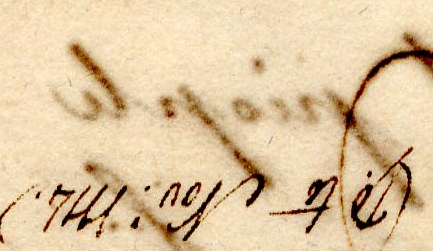(D. to Nov: 1774)
